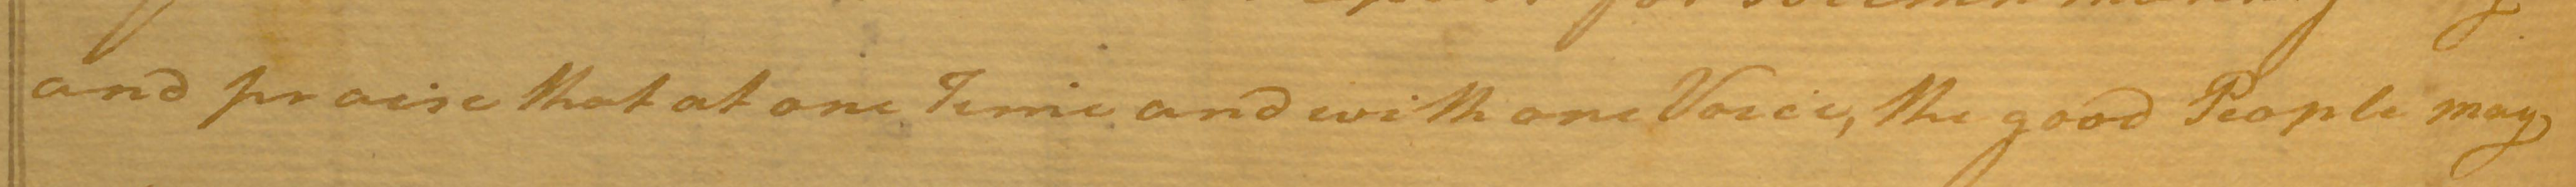and praise that at one Time and with one Voice, the good People may
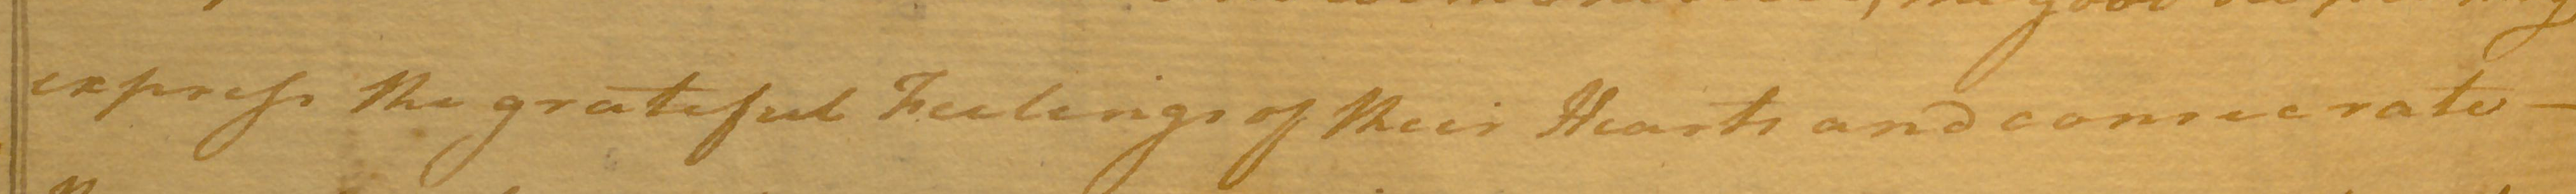express the grateful Feelings of their Hearts and consecrate-
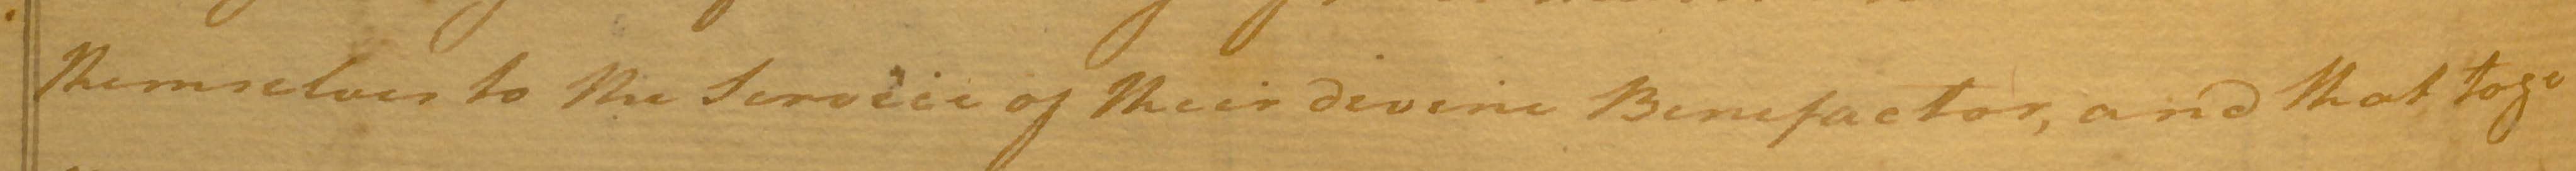themselves to the Service of their divine Benefactor, and that toge
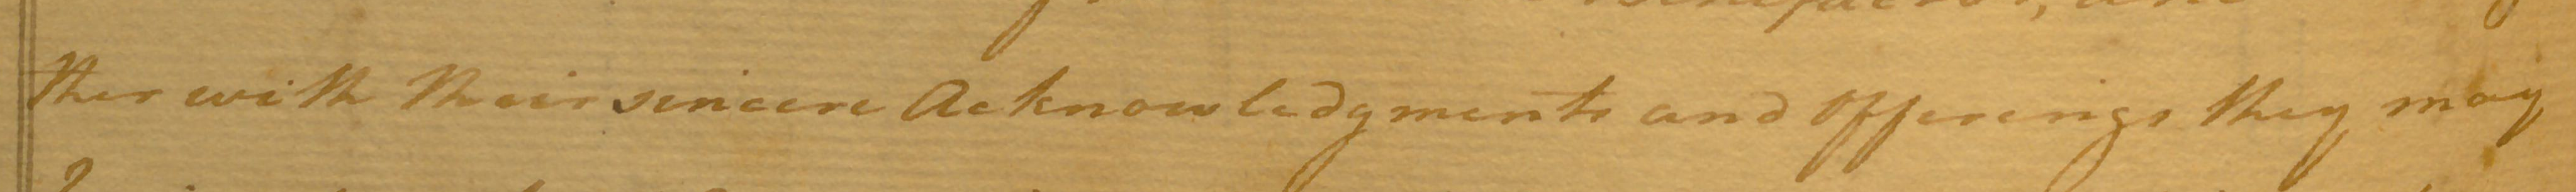ther with their sincere Acknowledgements and offerings they may
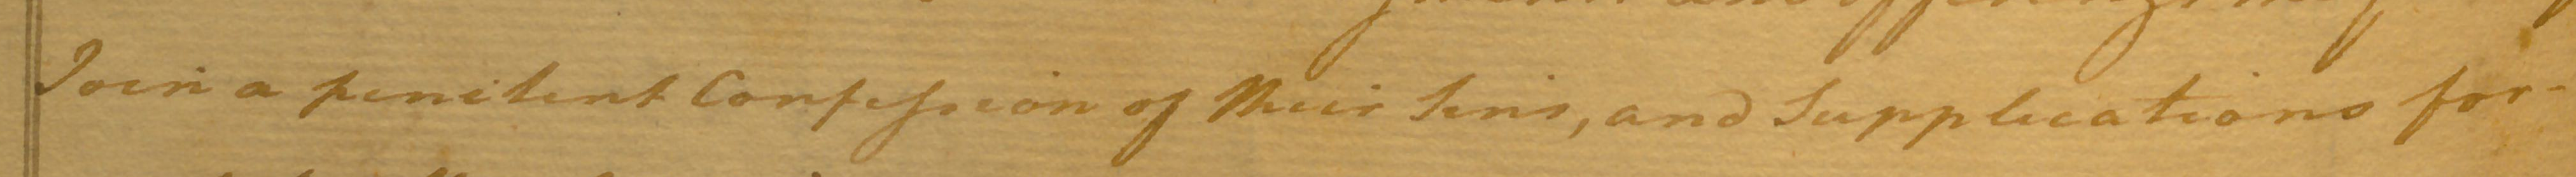Join a penitent confession of their Sins, and Supplications for-
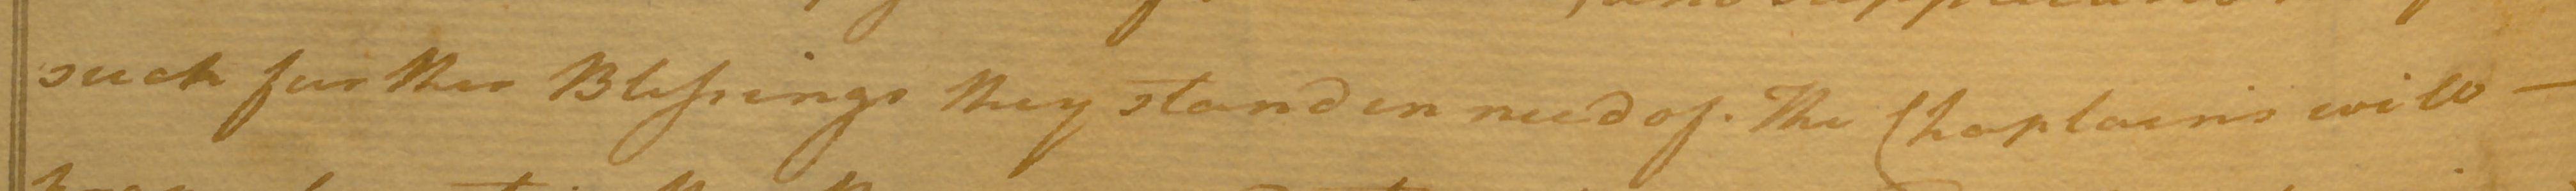such further Blessings they stand in need of. The Chaplains will-
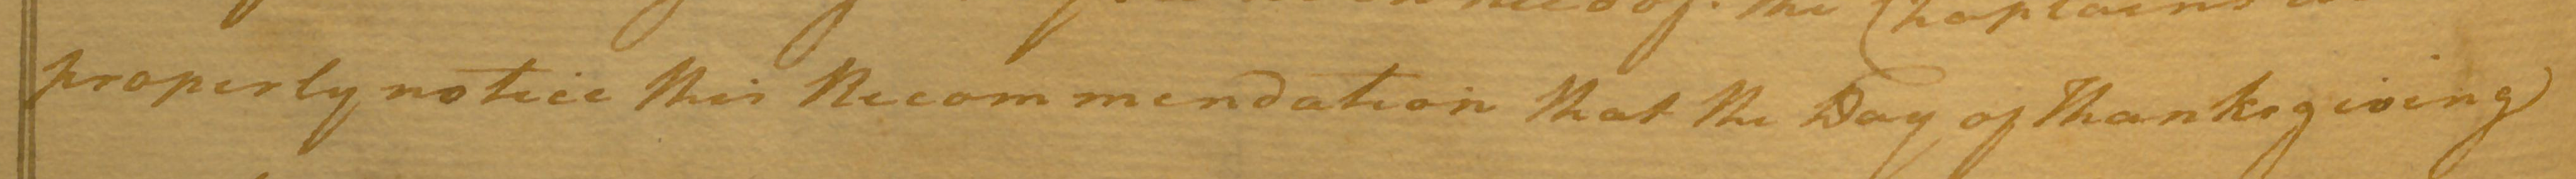properly notice their Recommendation that the Day of Thanksgiving
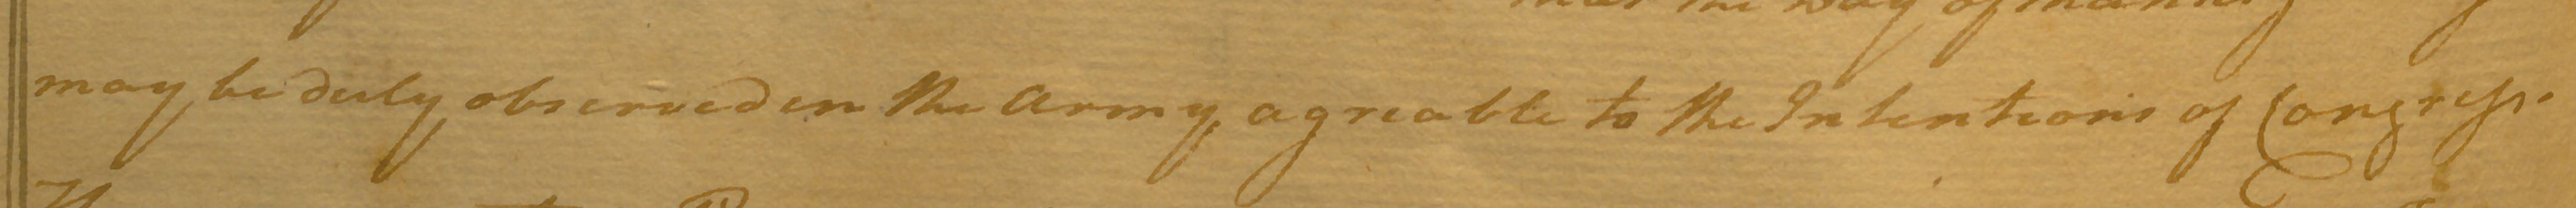may be duly observed in the Army agreable to the Intentions of Congress.
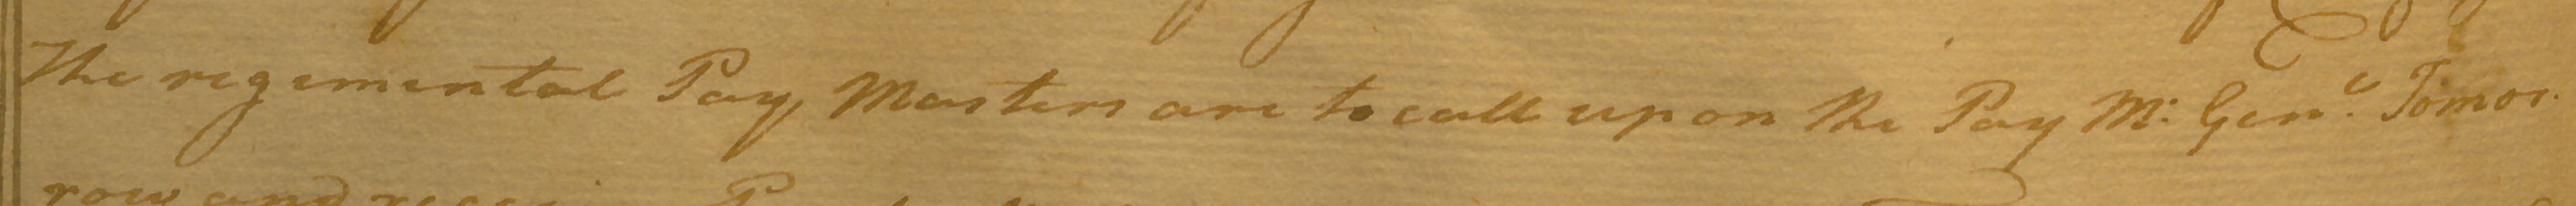The regimental Pay Masters are to call upon the Pay M: Gen^l. Tomor
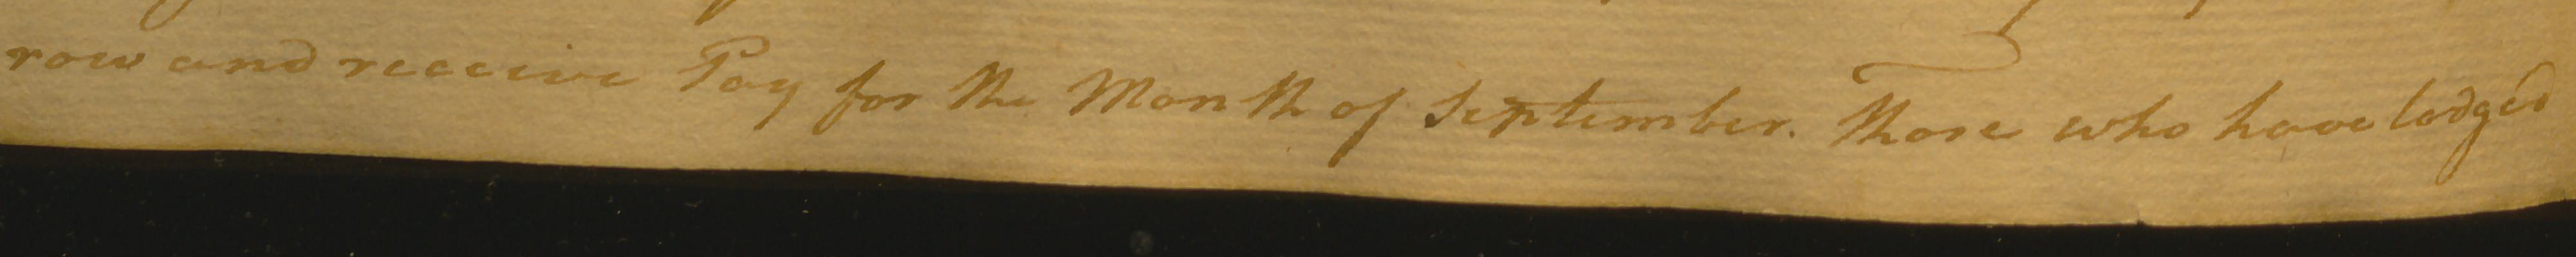row and receive Pay for the Month of September. Those who have lodged
